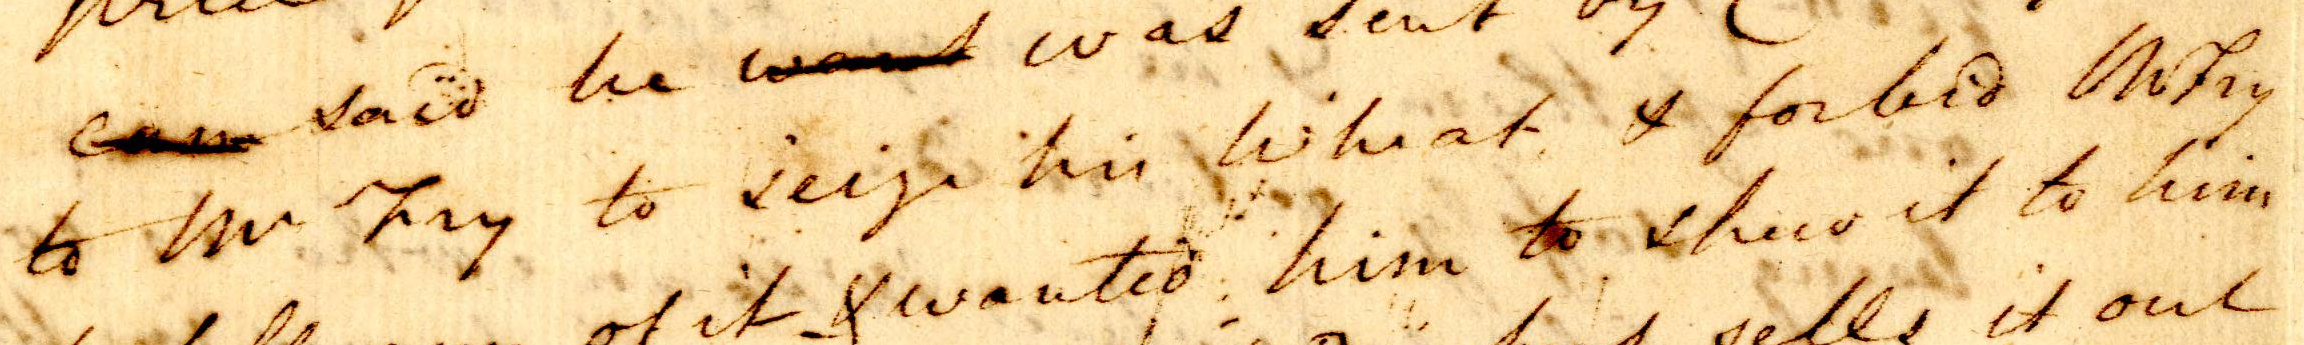to M^r Fry to seize his Wheat & forbid M^r Fry
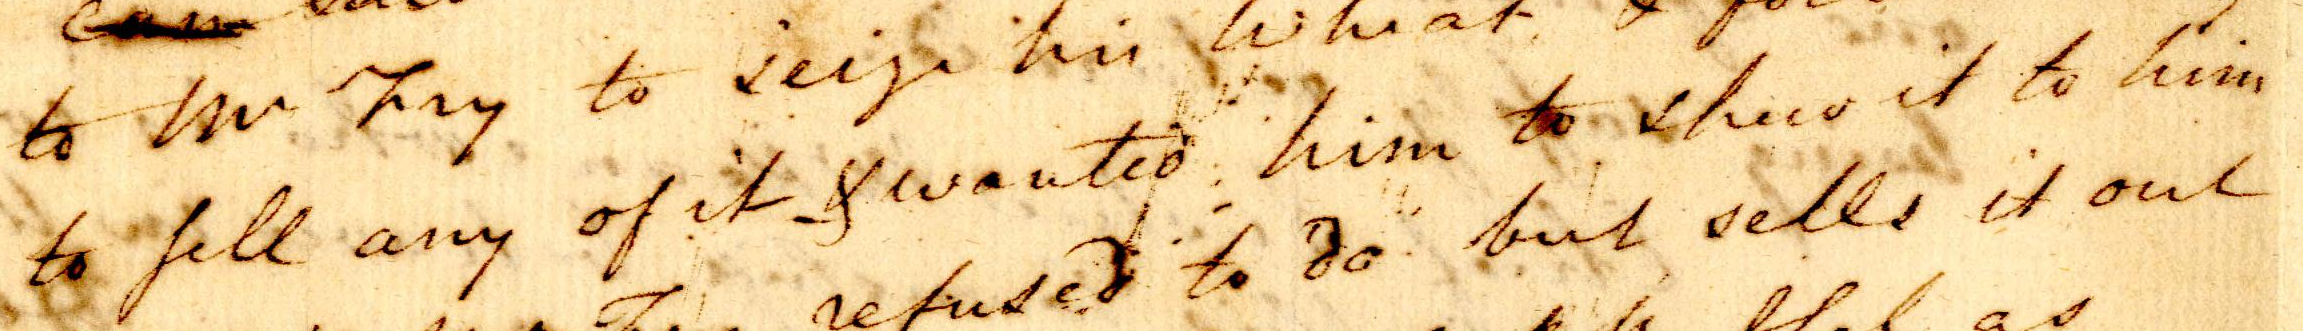to sell any of it & wanted him to shew it to him
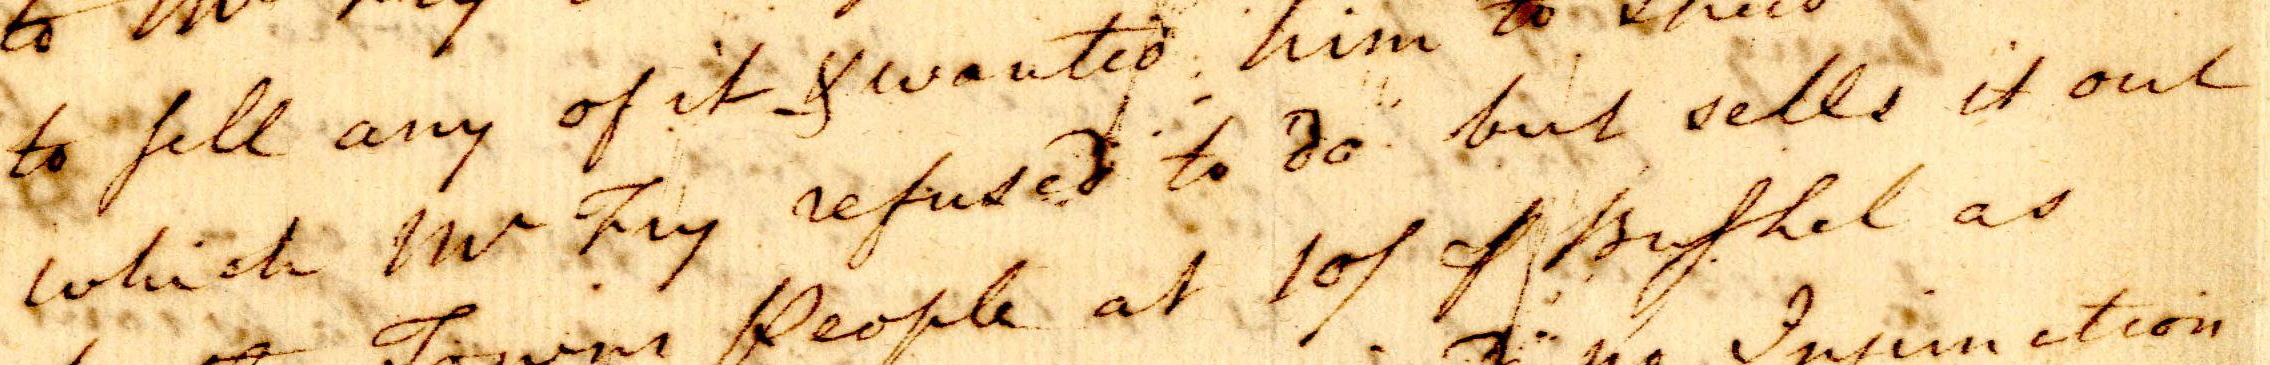which M^r Fry refused to do but sells it out
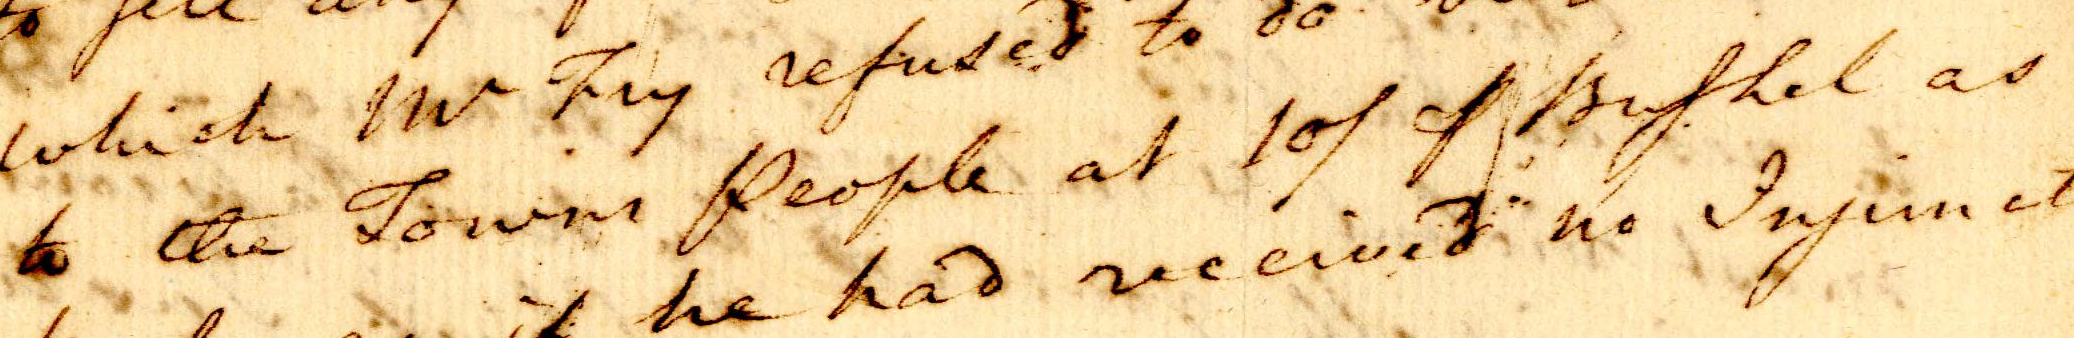to the Town's People at 10/ per Bushel as
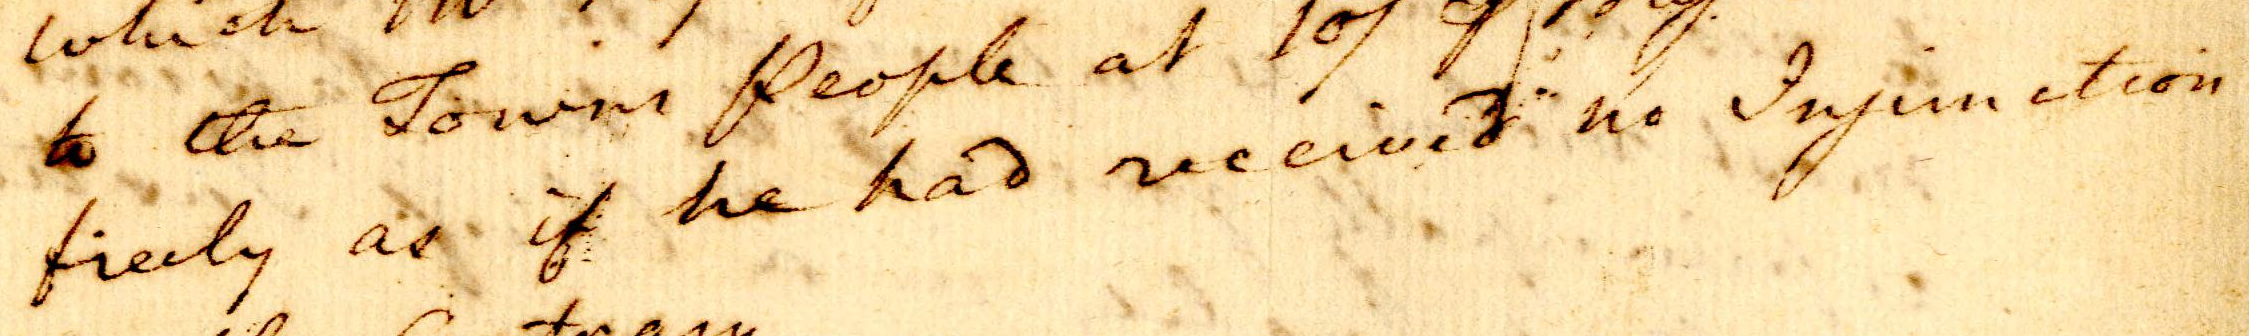freely as if he had received no Injunction
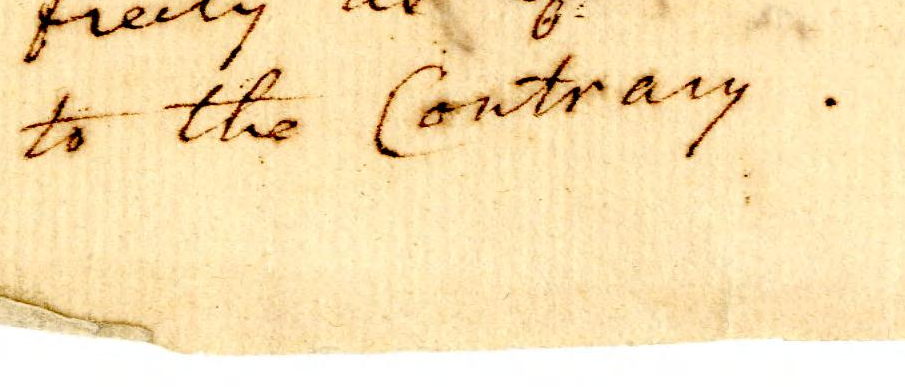to the Contrary.
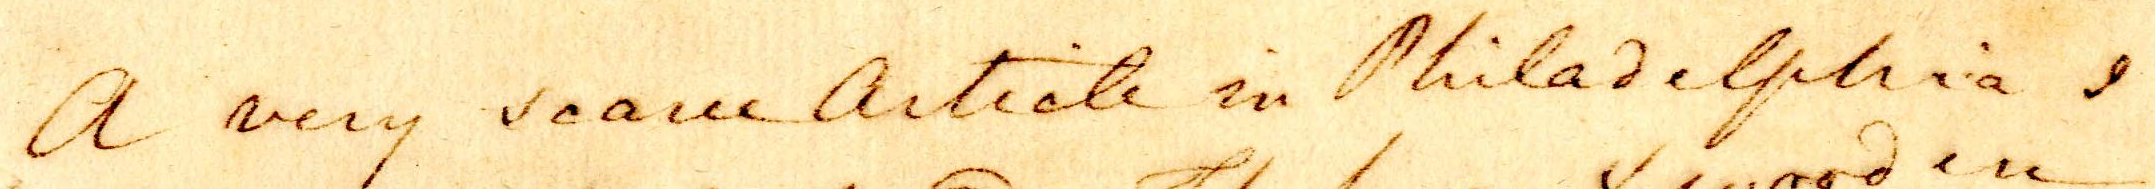A very scarce Article in & Philadelphia I
